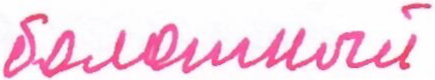болотный
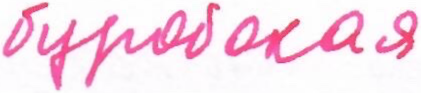буробокая
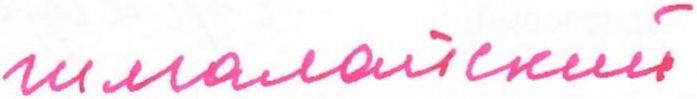гималайский
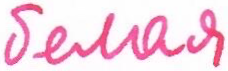белая
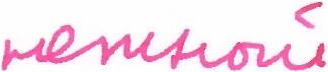южный
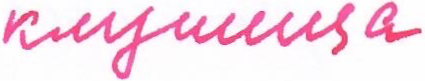клушица
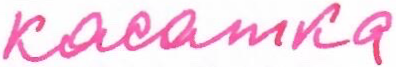касатка
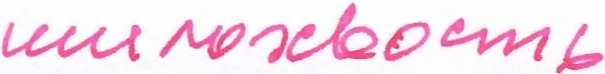шилохвость
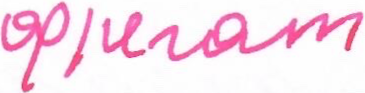фрегат
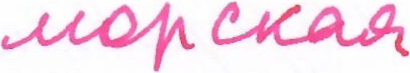морская
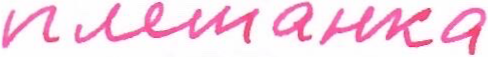плешанка
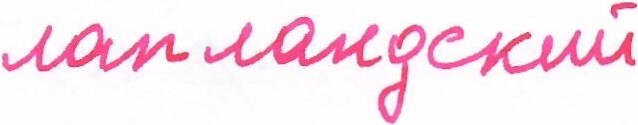лапландский
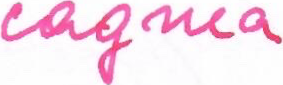саджа
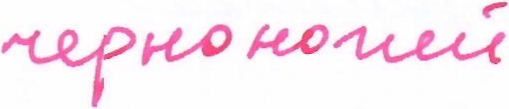черноногий
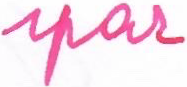грач
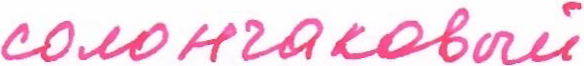солончаковый
